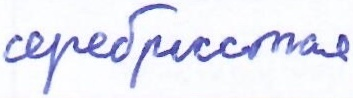серебристая
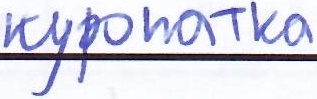куропатка
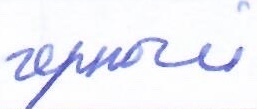черный
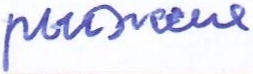рыжая
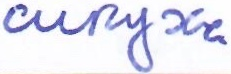сипуха
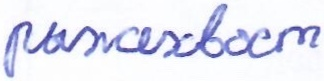рыжехвост
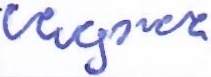саджа
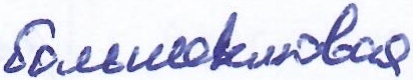большеклювая
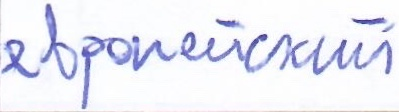европейский
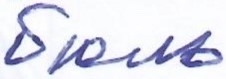бюль
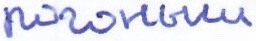погоныш
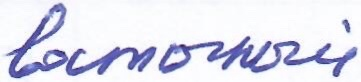восточный
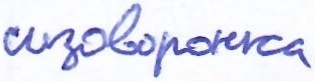сизоворонка
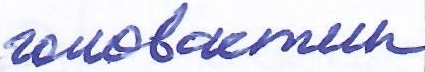головастик
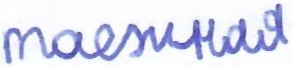таежная
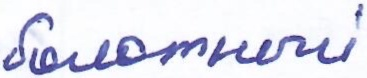болотный
